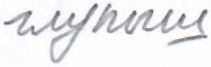глупыш
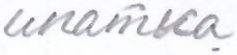ипатка
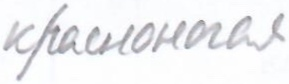красноногая
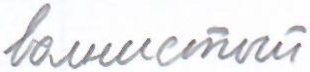волнистый
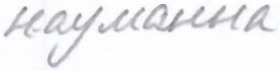науманна
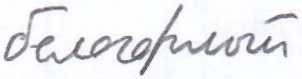белогорлый
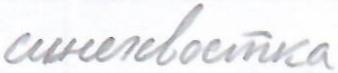синехвостка
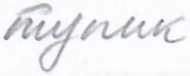тупик
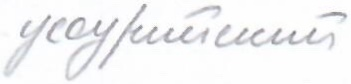уссурийский
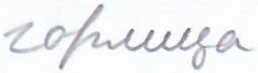горлица
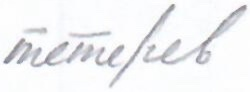тетерев
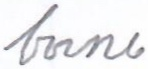выпь
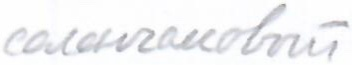солончаковый
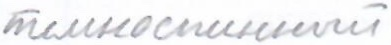темноспинный
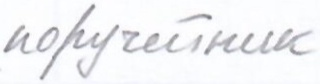поручейник
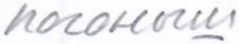погоныш
